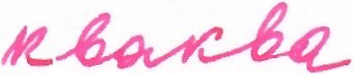кваква
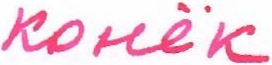конёк
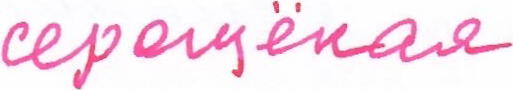серощёкая
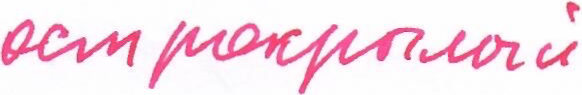острокрылый
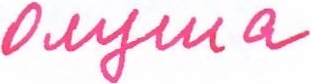олуша
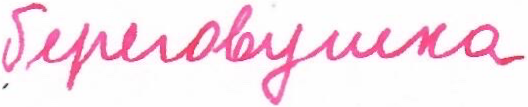береговушка
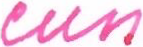сип
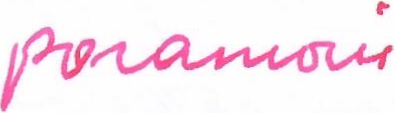рогатый
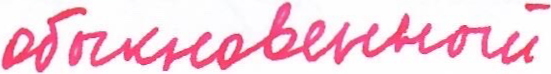обыкновенный
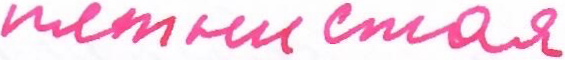пятнистая
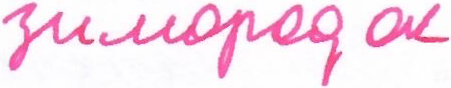зимородок
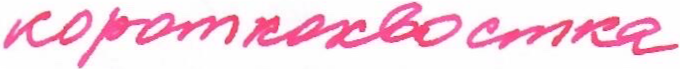короткохвостка
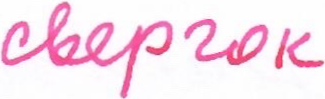сверчок
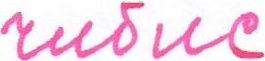чибис
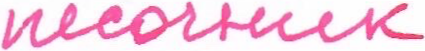песочник
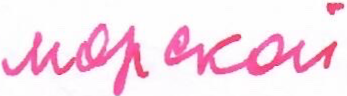морской
